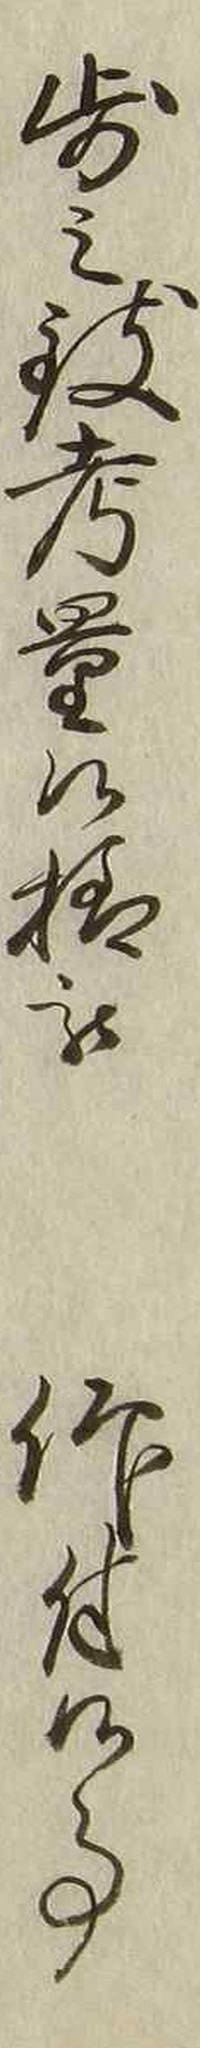歩之致考量候様被仰付候事
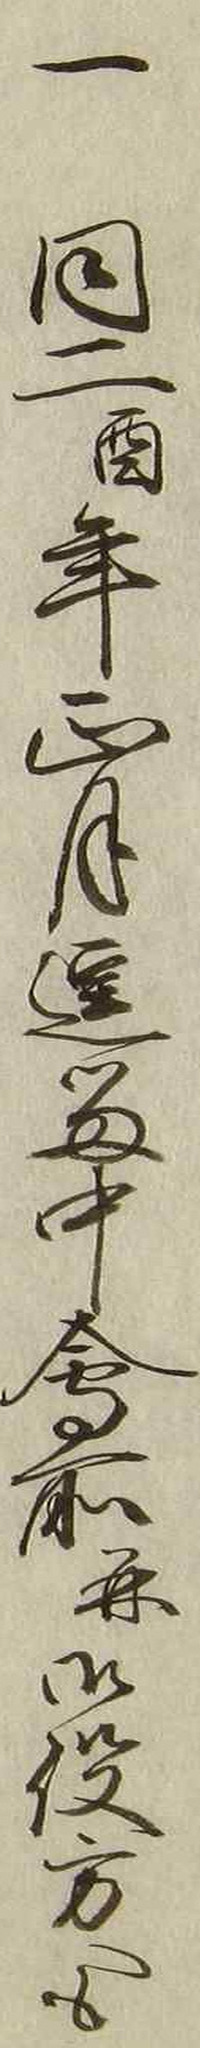一同二酉年正月逗留中会所并御役方へも
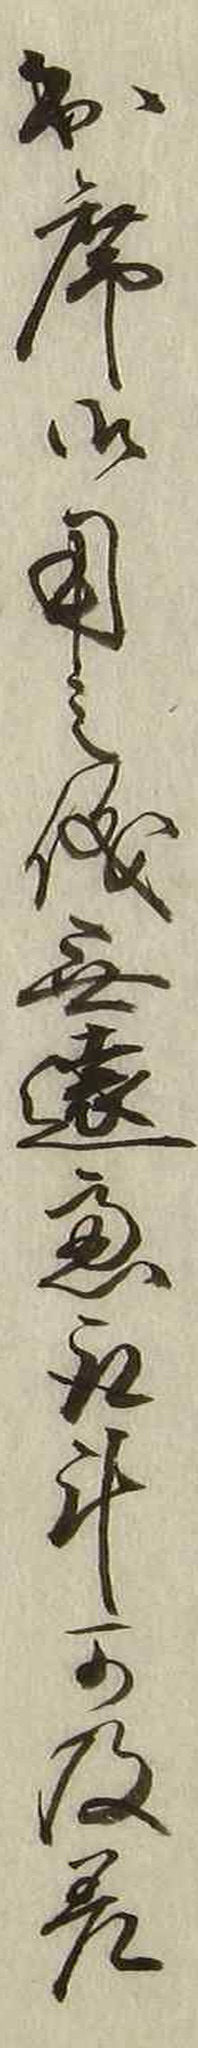出席御用之儀無遠慮取計可及差
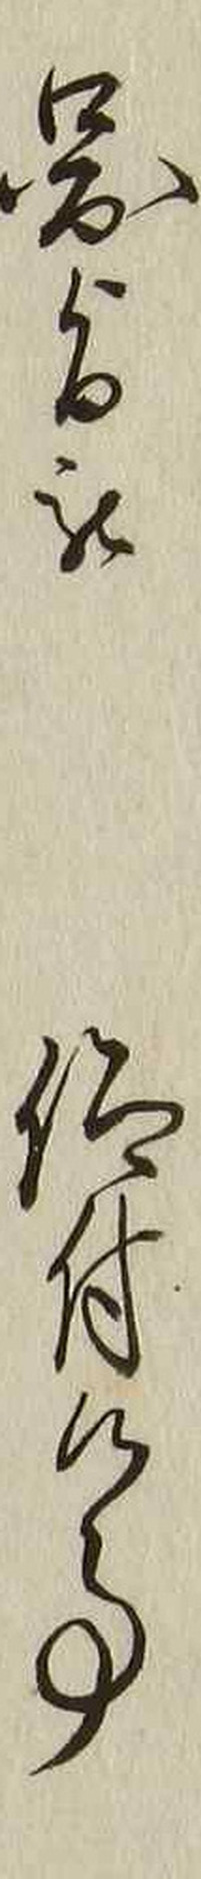図旨被仰付候事
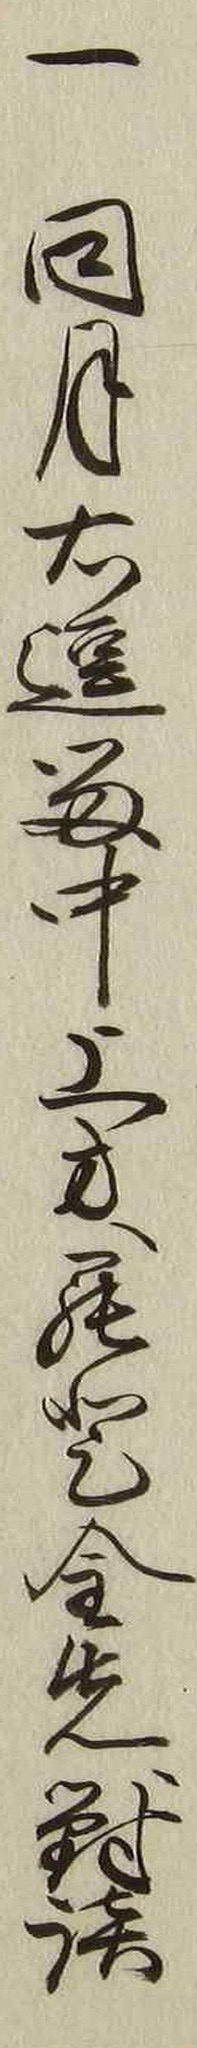一同月右逗留中上方へ罷登金先へ対談
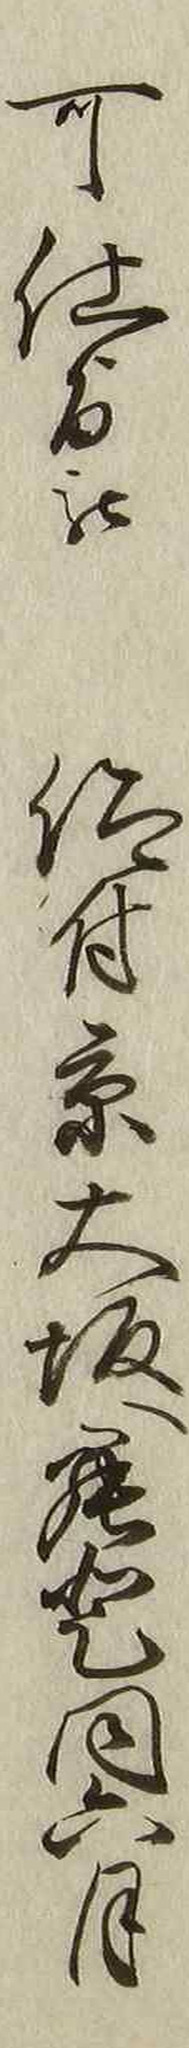可仕旨被仰付京大坂へ罷登同六月
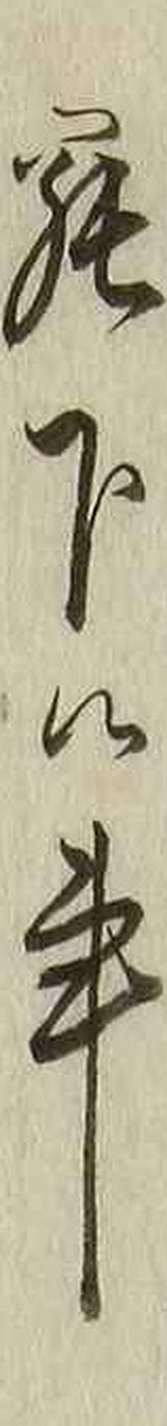罷下候事
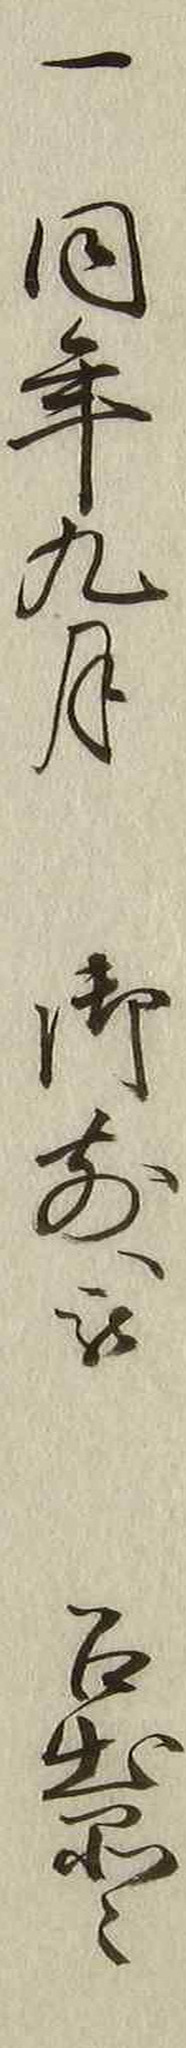一同年九月御前へ被召出品々
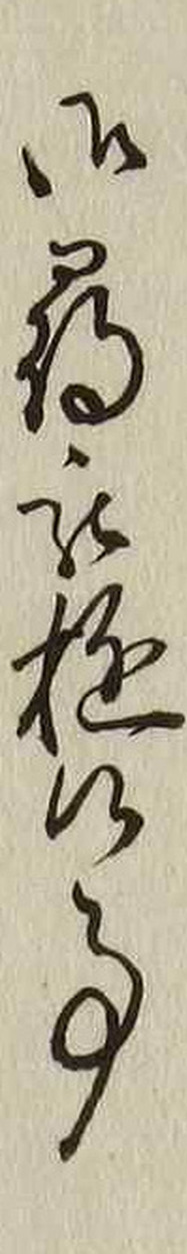御尋被遊候事
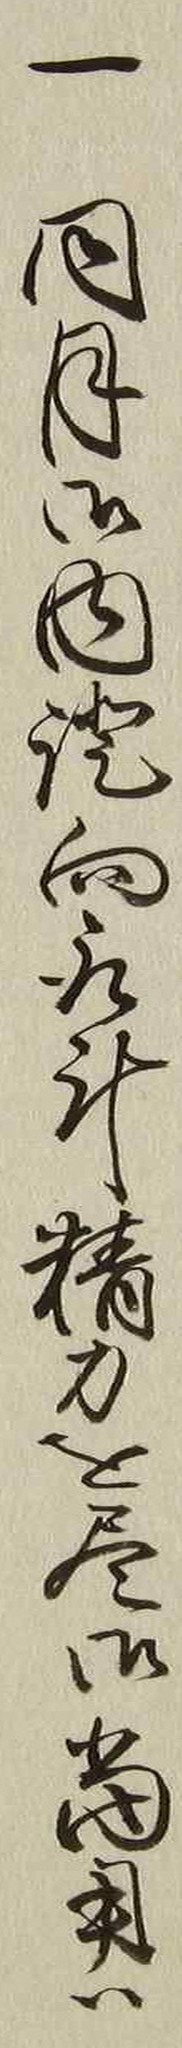一同月御内証向取計精力を尽御当用ハ
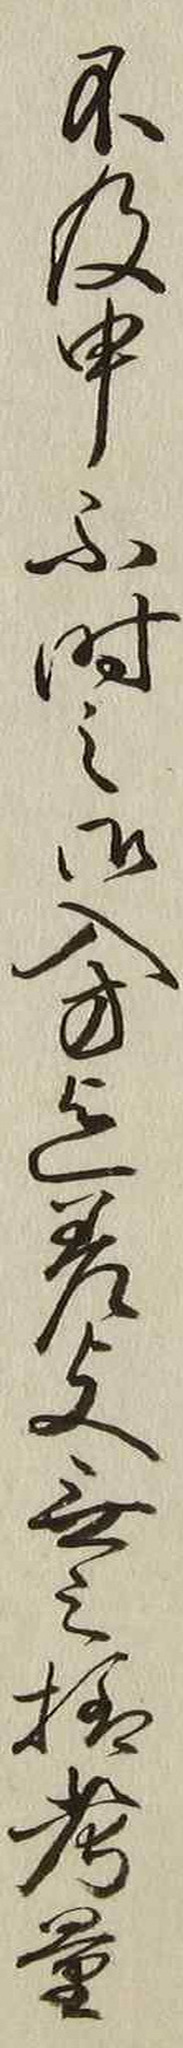不及申不時之御入方迄差支無之様考量
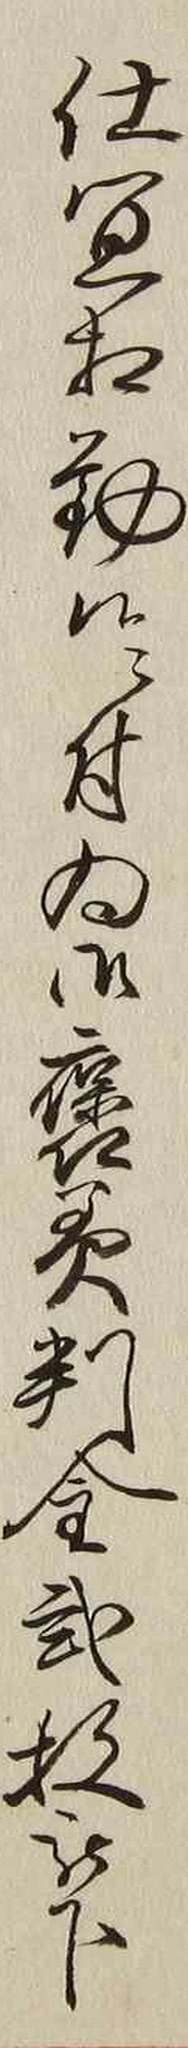仕宜相勤候ニ付為御褒美判金弐枚被下
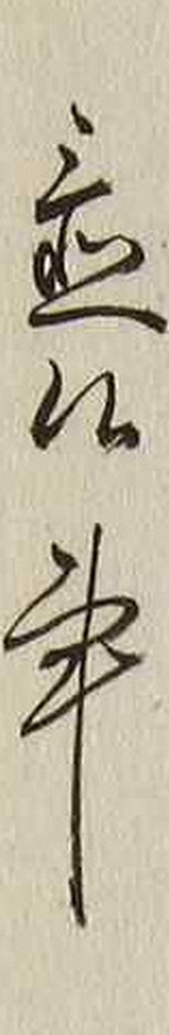置候事
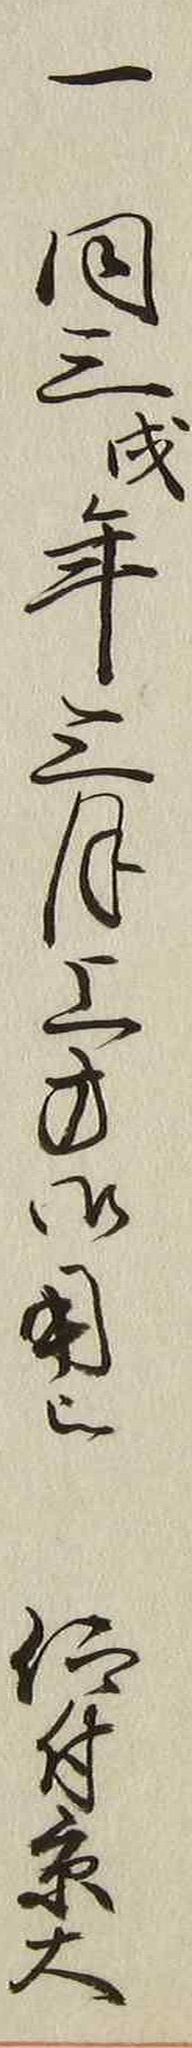一同三戌年三月上方御用被仰付京大
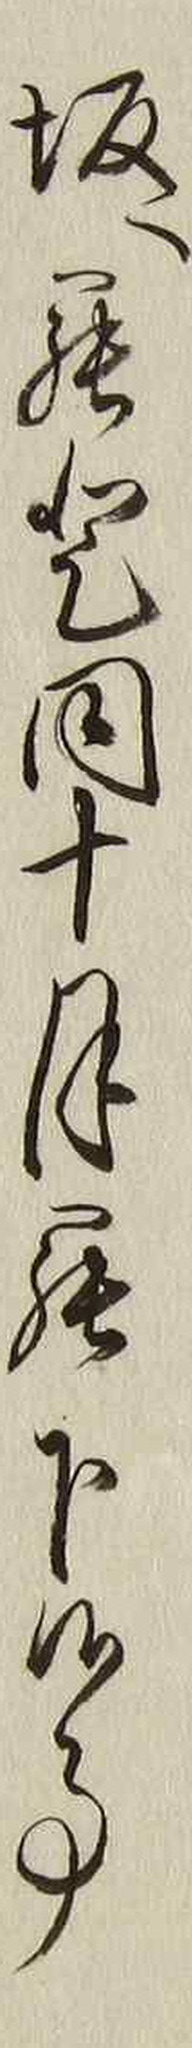坂へ罷登同十月罷下候事
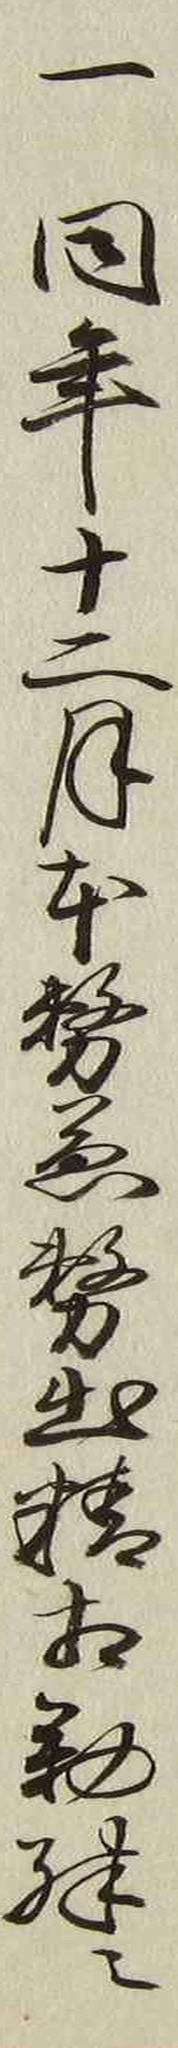一同年十二月本務兼務出精相勤殊ニ
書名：諸士系譜　巻之21　い之部21
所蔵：会津若松市立会津図書館
